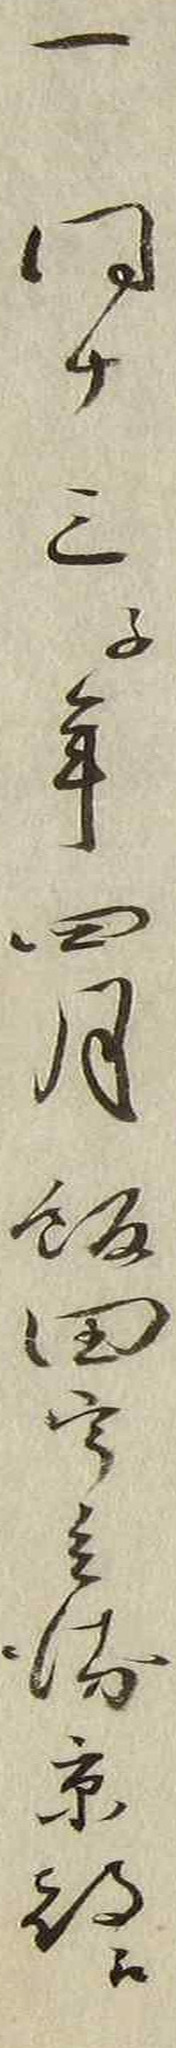一同十三子年四月飯田宇兵衛京都へ

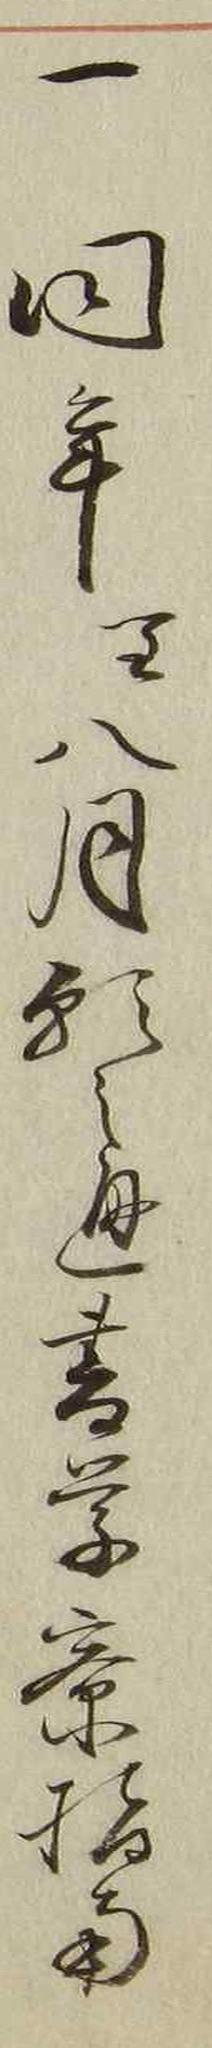一同年閏八月願い之通り書学寮指南
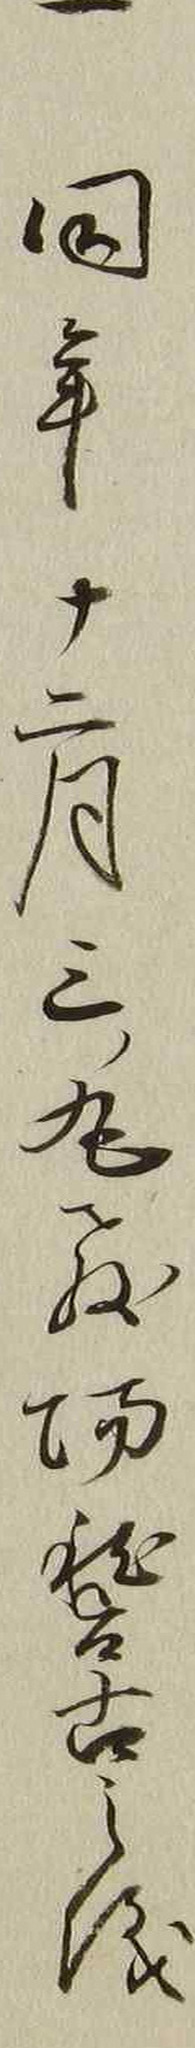一同年十二月三ノ丸教場稽古之儀
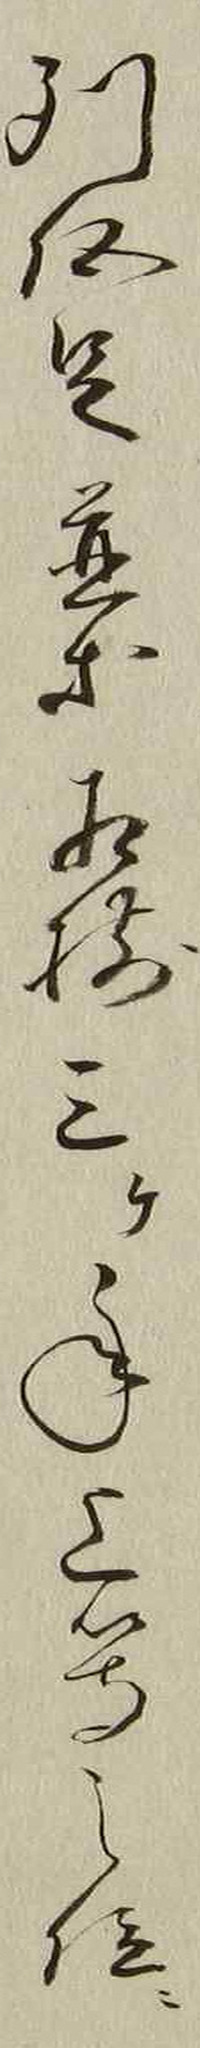列伍足並等相揃い三ケ年上等之位ニ
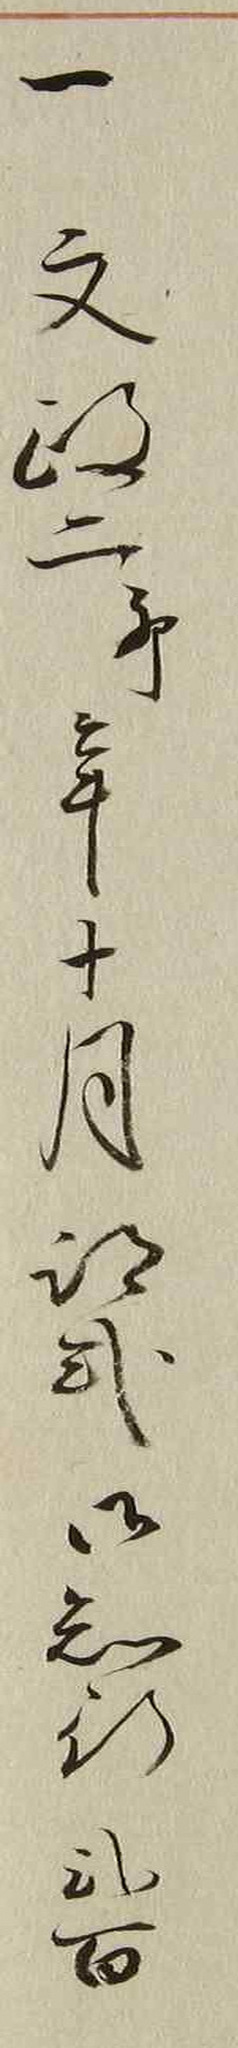一文政二卯年十月跡式御知行弐百
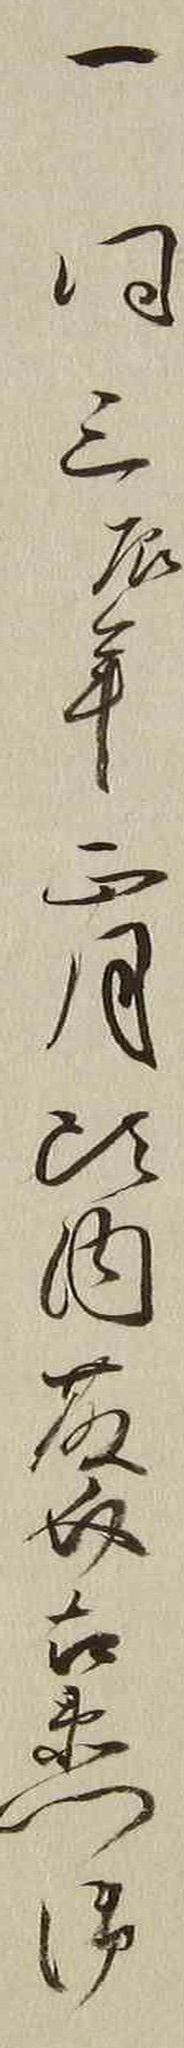一同三辰年正月頭内藤介右衛門御
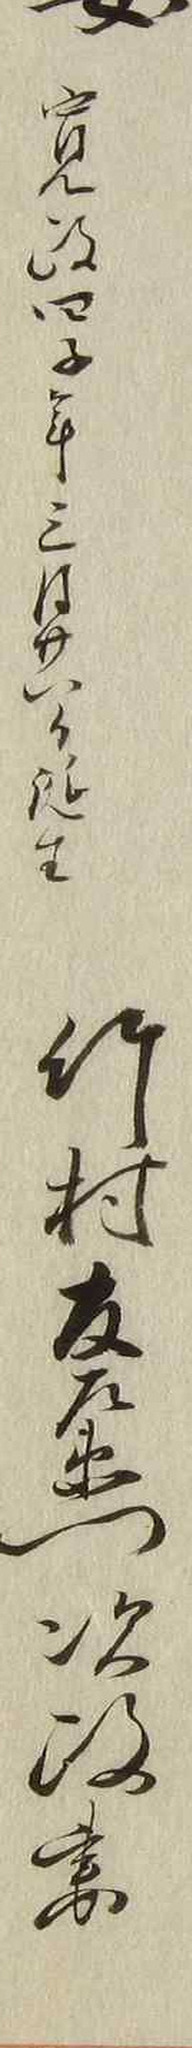女寛政四子年三月廿八日誕生竹村友左衛門次政妻
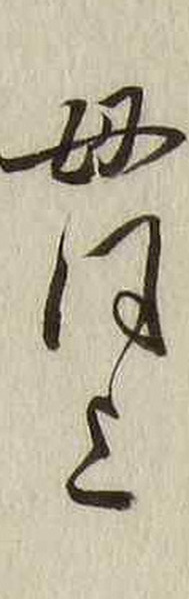母同上
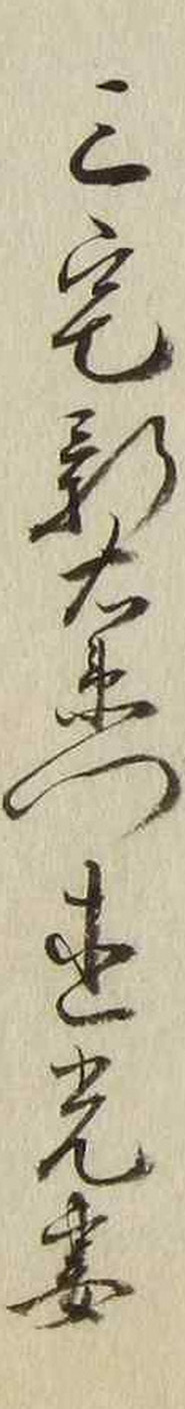女三宅新右衛門直光妻

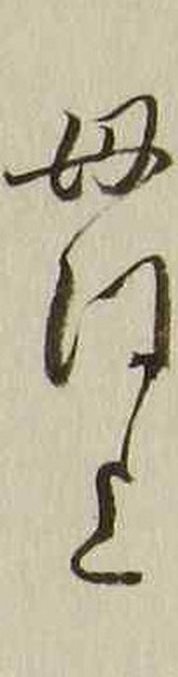母同上
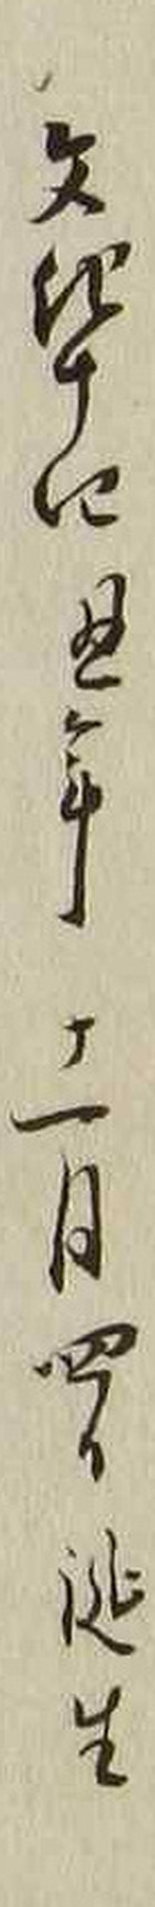源之助文政四丑年十一月四日誕生
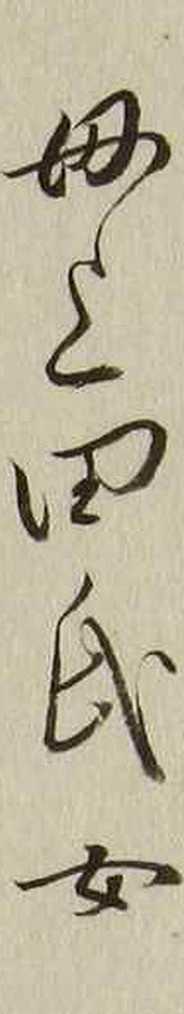母上田氏女
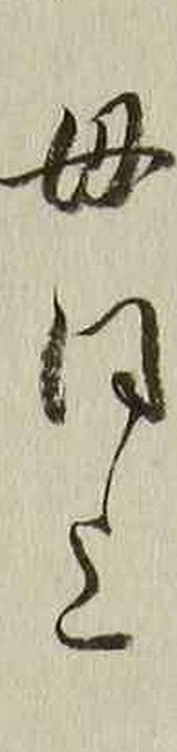母同上
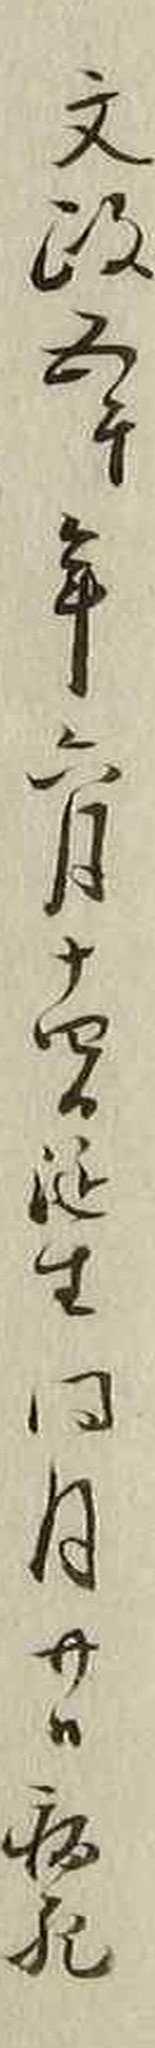文政五午年六月十四日誕生同月廿日病死
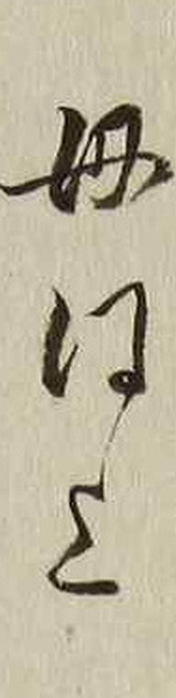母同上

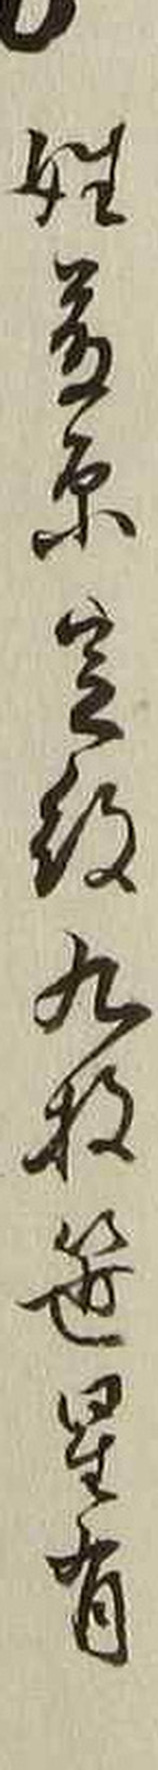姓藤原定紋九枚笹星有
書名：諸士系譜　巻之20　い之部20
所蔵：会津若松市立会津図書館
